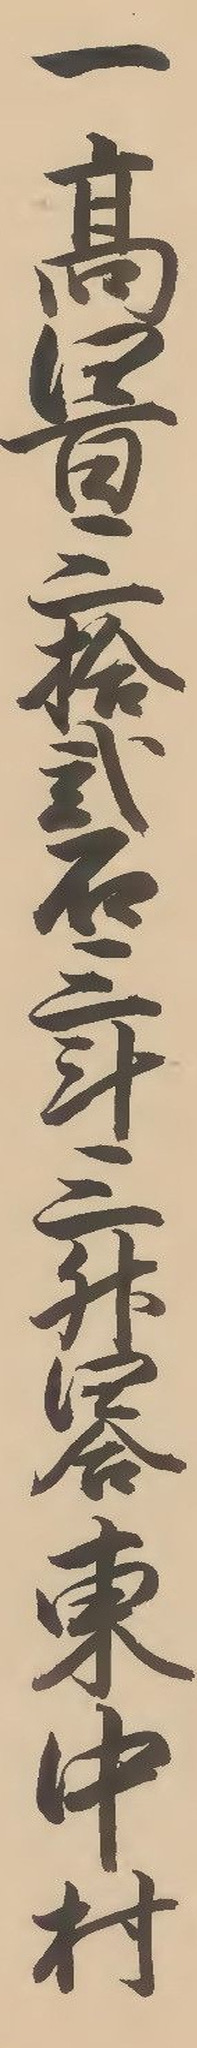一髙四百三拾弐石三斗三升四合東中村
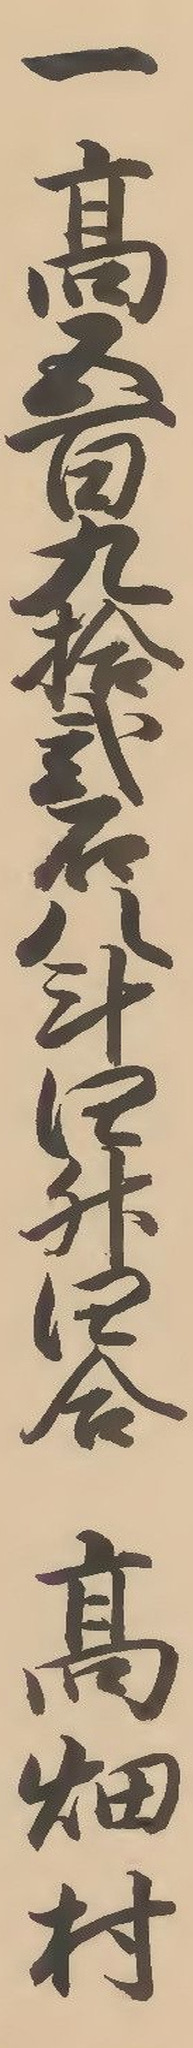一髙五百九拾弐石八斗四升四合髙畑村

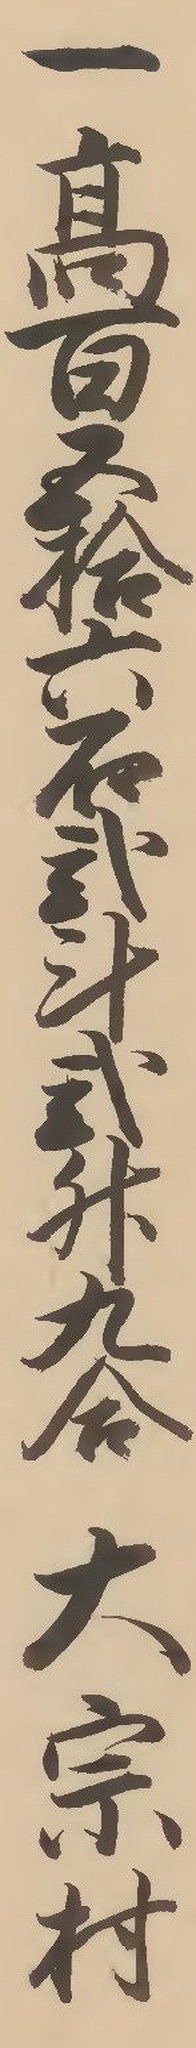一髙百五拾六石弐斗弐升九合大宗村
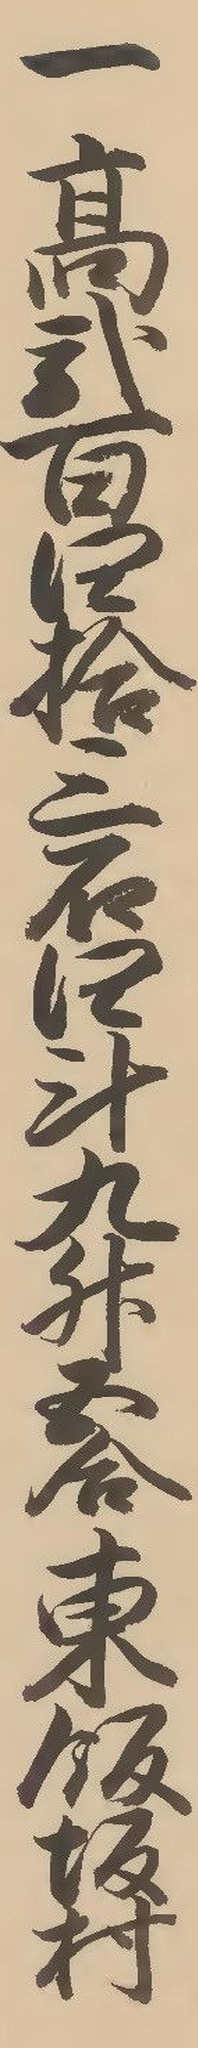一髙弐百四拾三石四斗九升五合東飯坂村
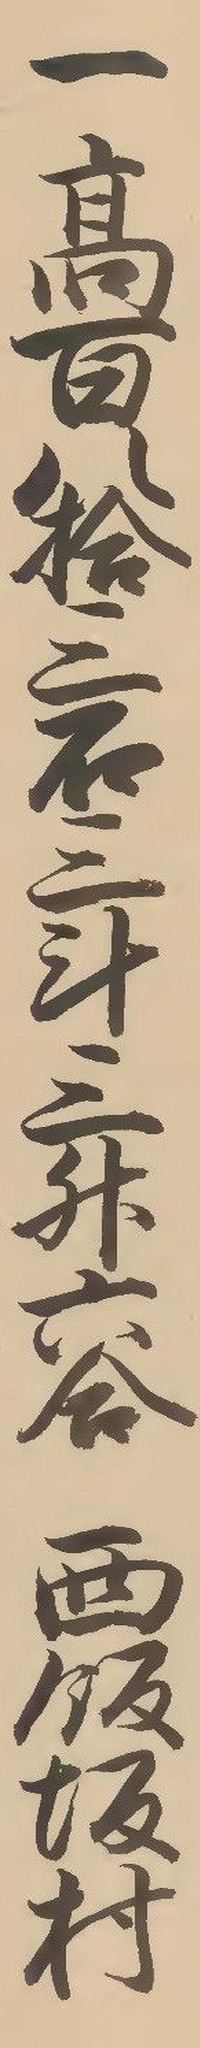一髙百八拾三石三斗三升六合西飯坂村
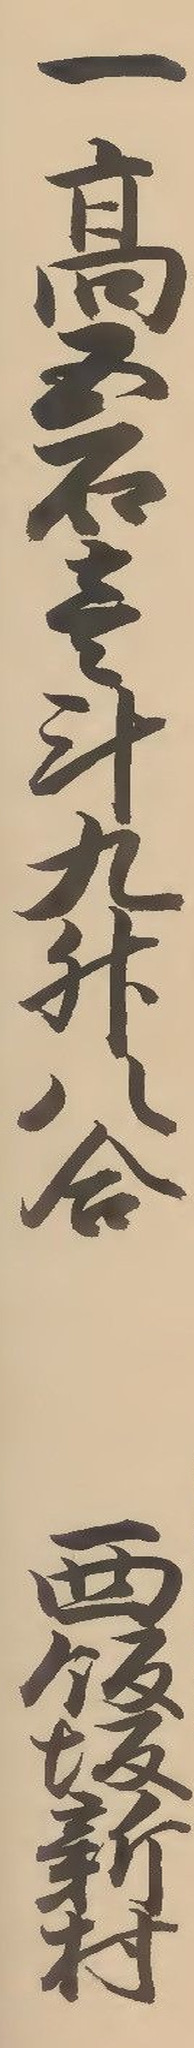一髙五石壱斗九升八合西飯坂新村
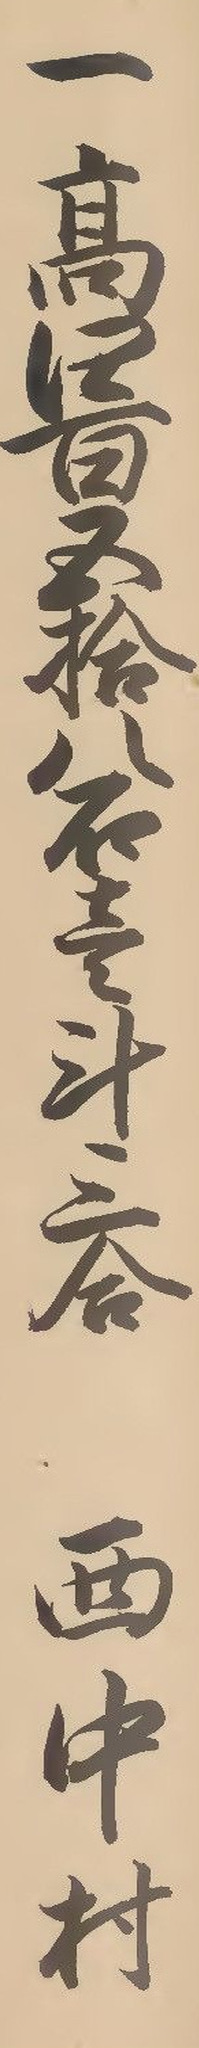一髙四百五拾八石壱斗三合西中村
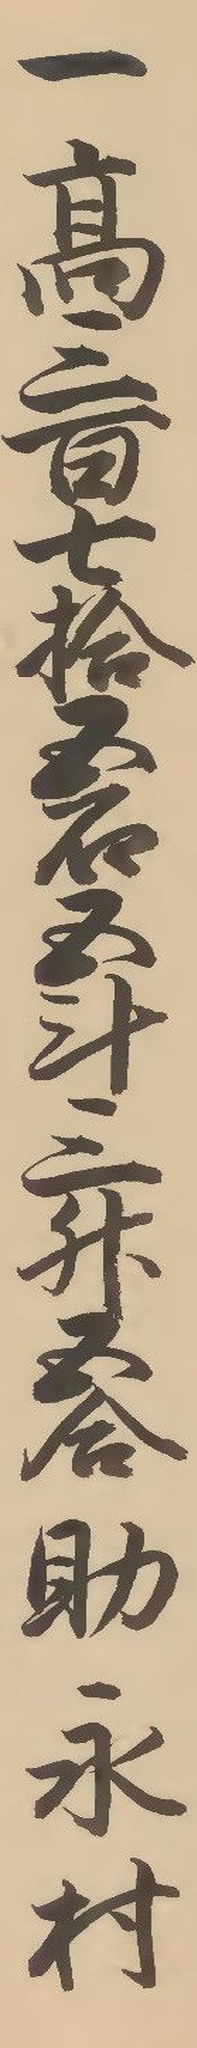一髙三百七拾五石五斗三升五合助永村
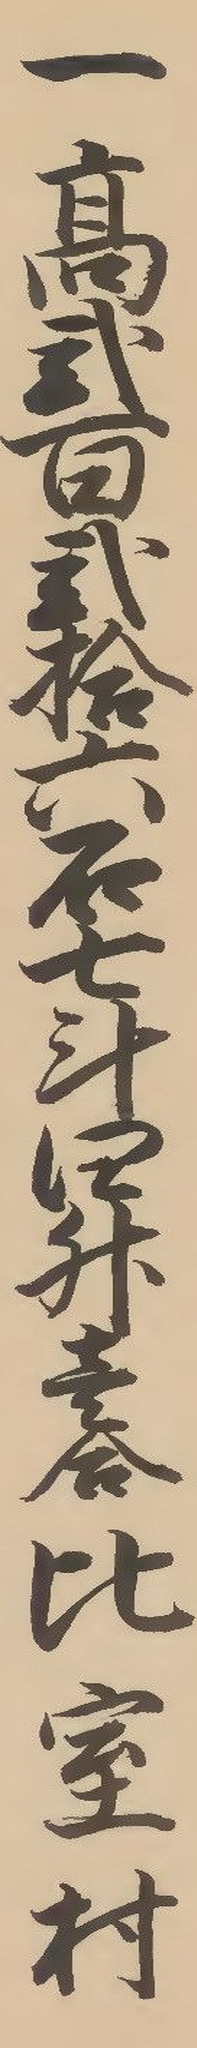一髙弐百弐拾六石七斗四升壱合比室村
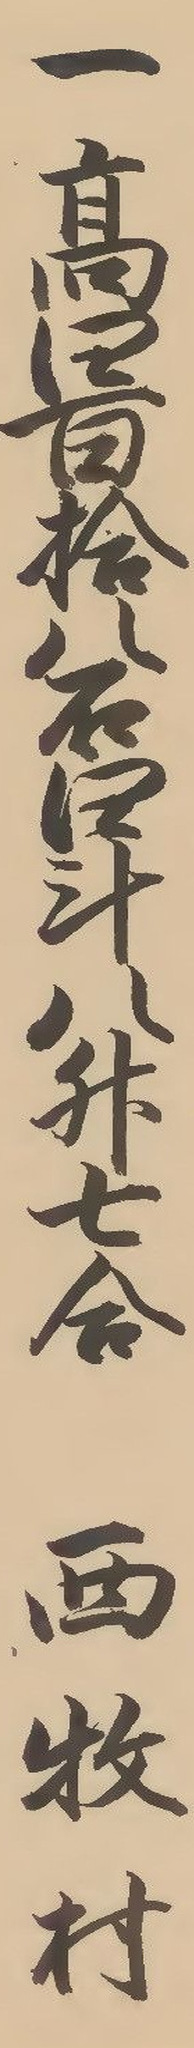一髙四百拾八石四斗八升七合西牧村

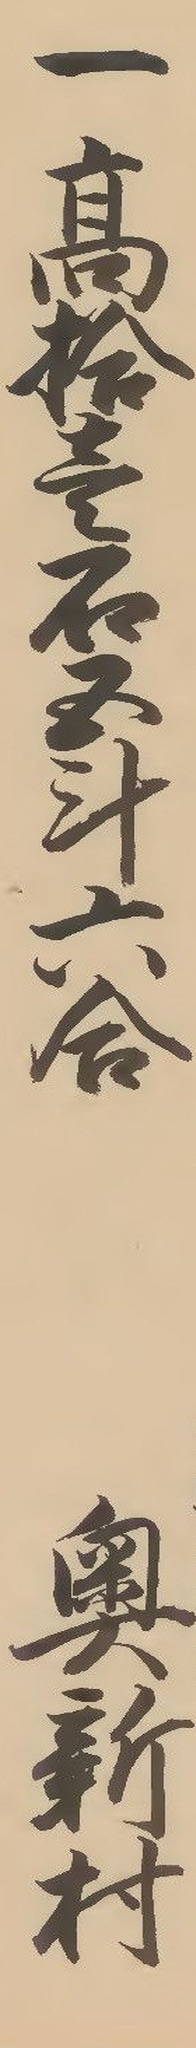一髙拾壱石五斗六合奥新村
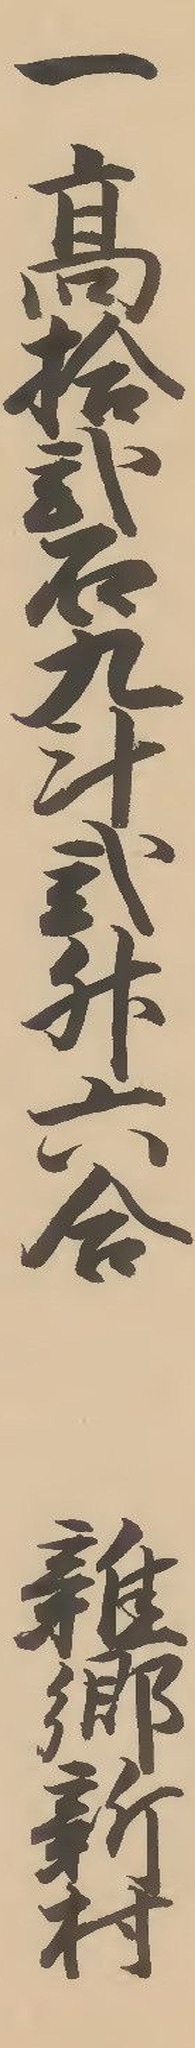一髙拾弐石九斗弐升六合雑郷新村
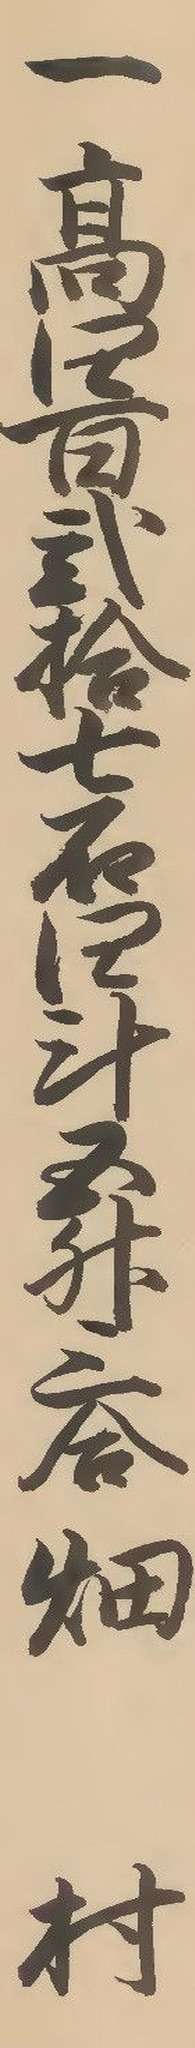一髙四百弐拾七石四斗五升三合畑村
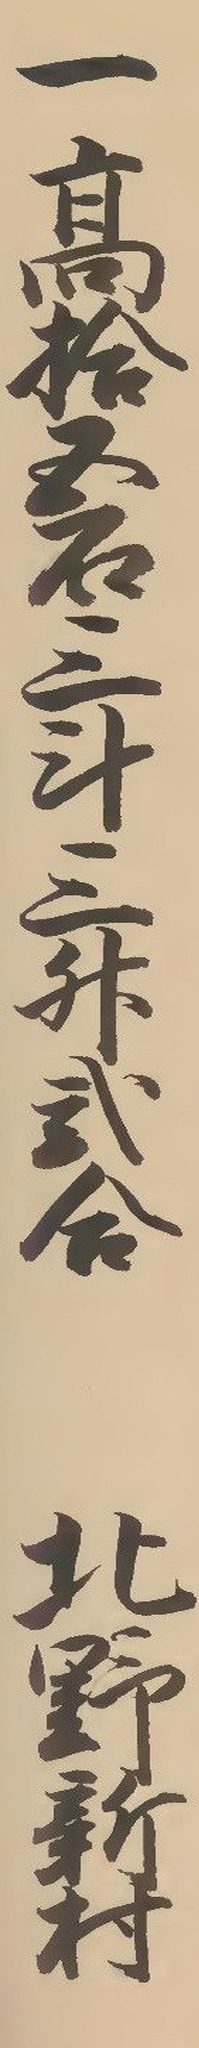一髙拾五石三斗三升弐合北野新村
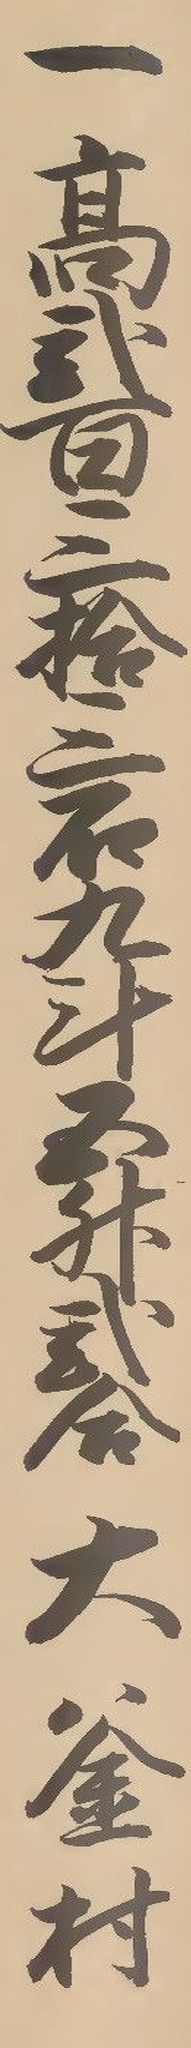一髙弐百三拾三石九斗五升弐合大釜村
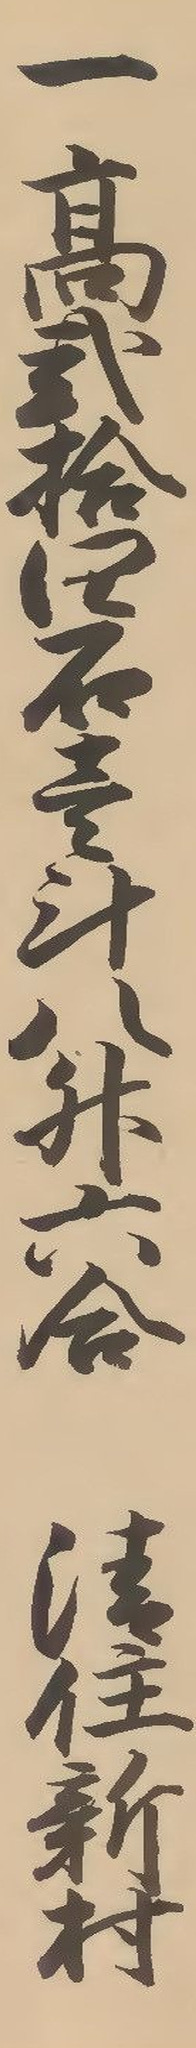一髙弐拾四石壱斗八升六合清住新村
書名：播磨国郷帳
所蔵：国立公文書館 National Archives of Japan
